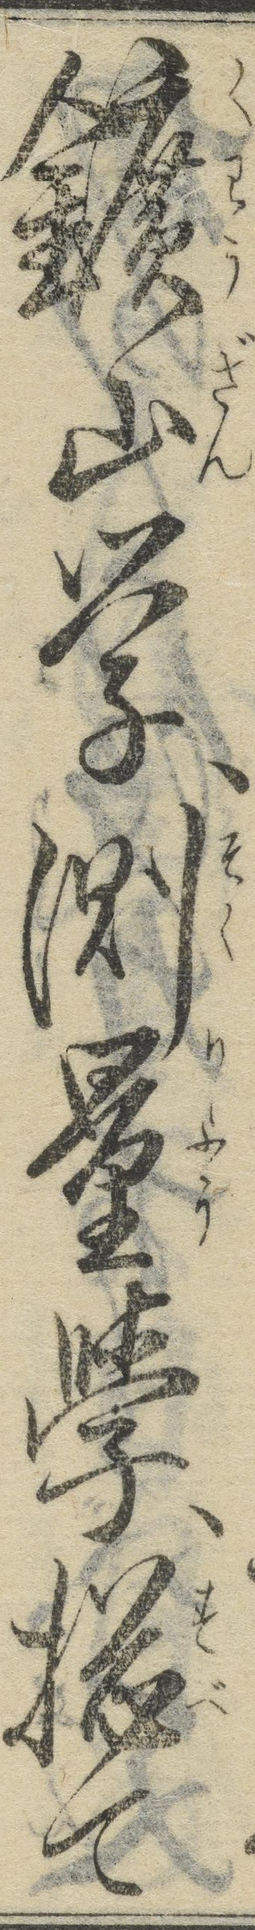鉱山学、測量学、摠て
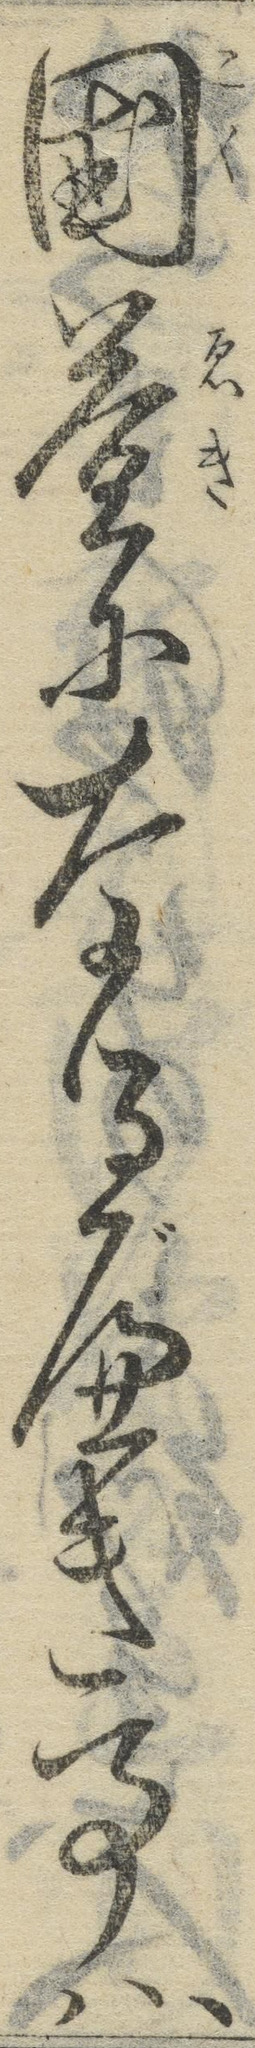国益になるべき事は、
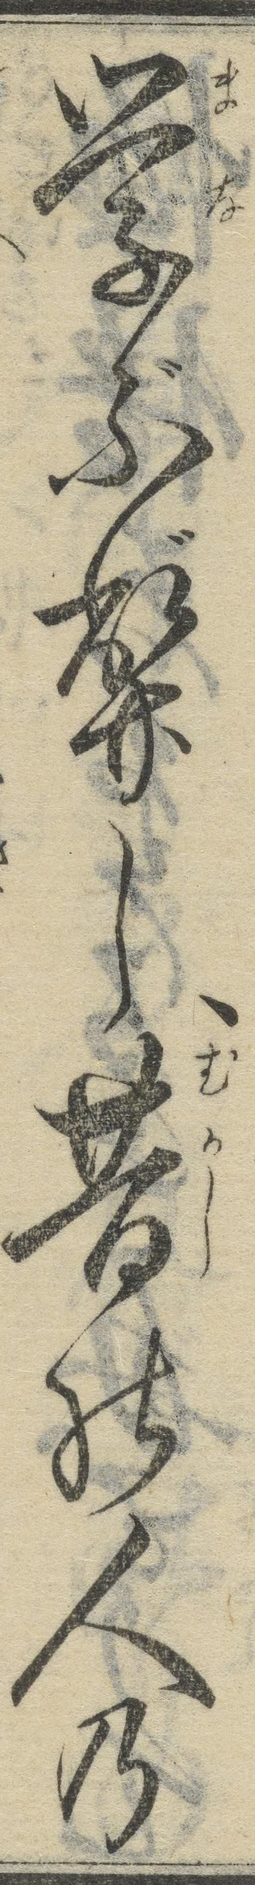学ぶべし、昔の人の
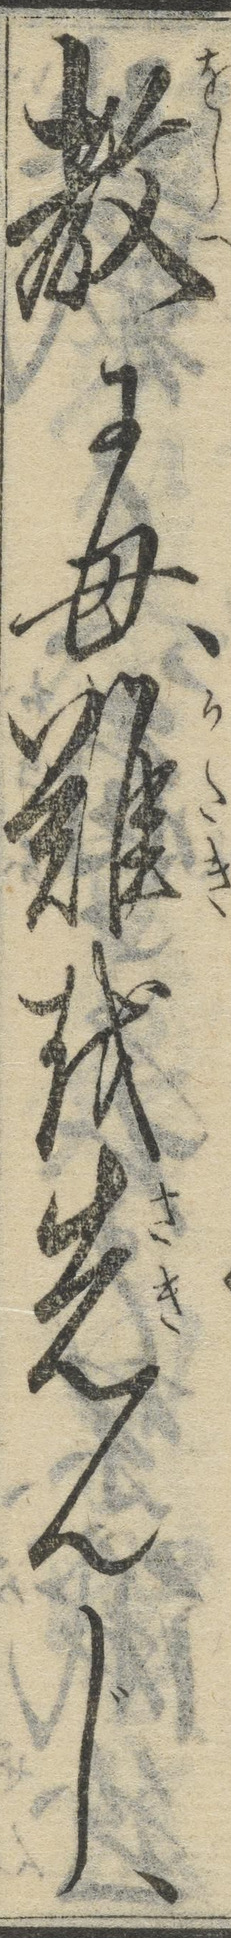教にも、難を先んじ、
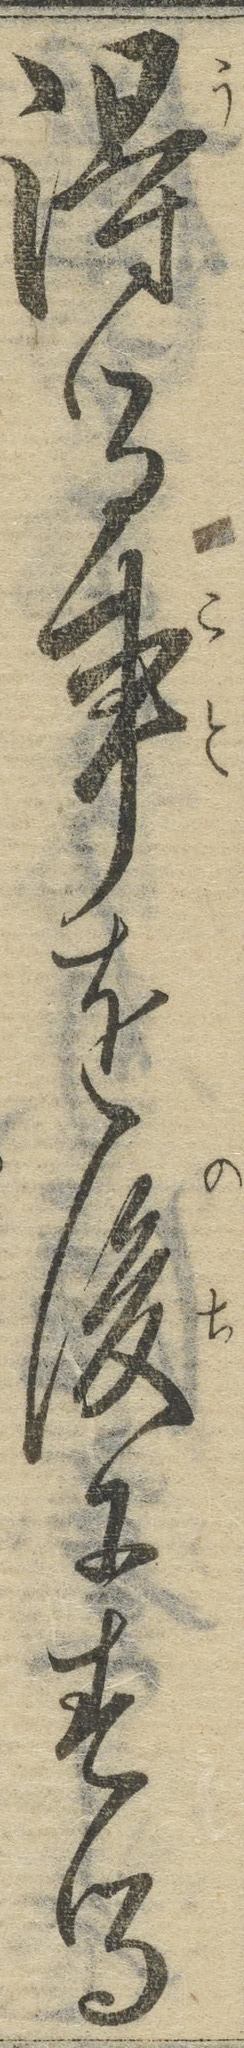得る事を後にする
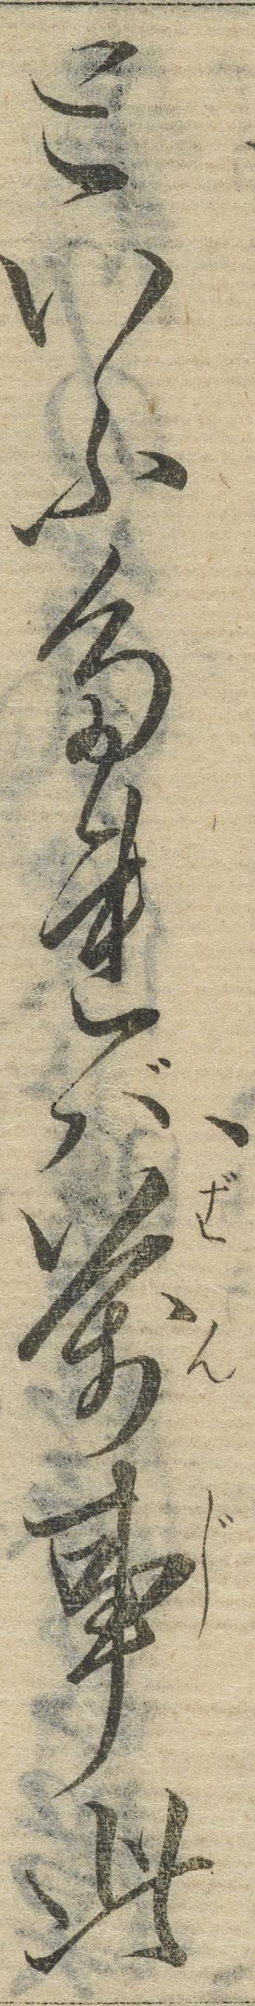といふなれば、万事此
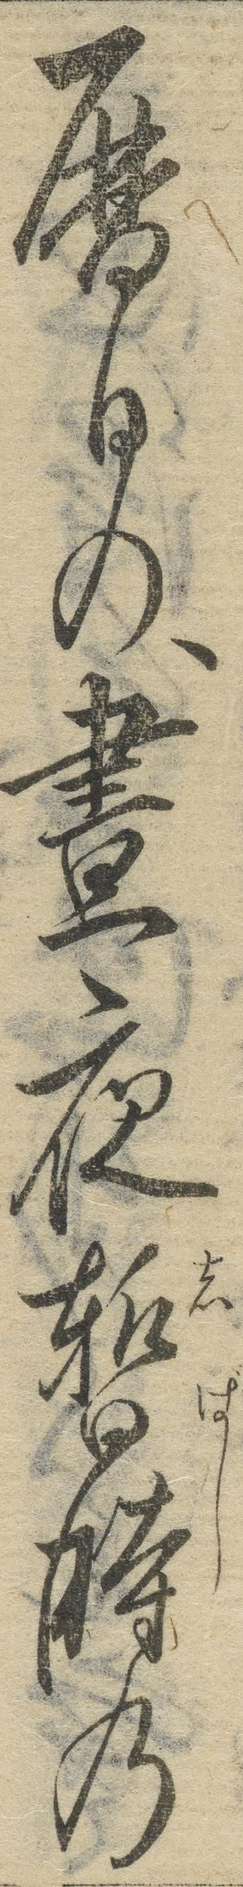暦日の、昼夜暫時の
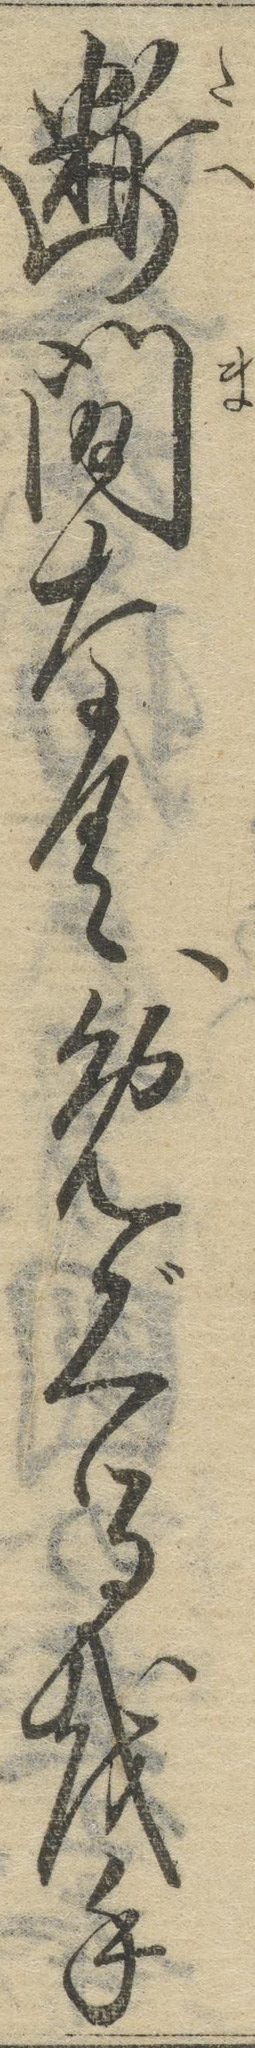断間なく、めぐるを手
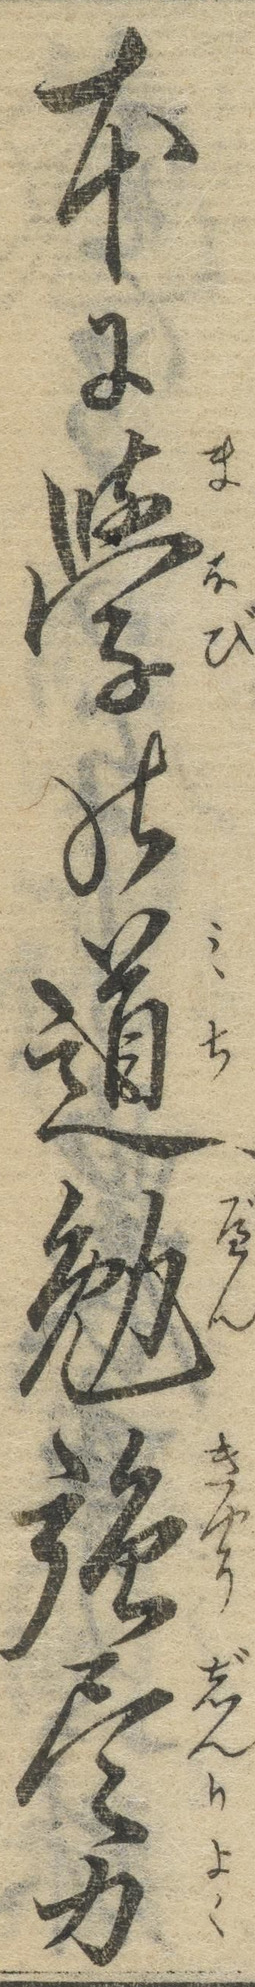本に学の道、勉強尽力

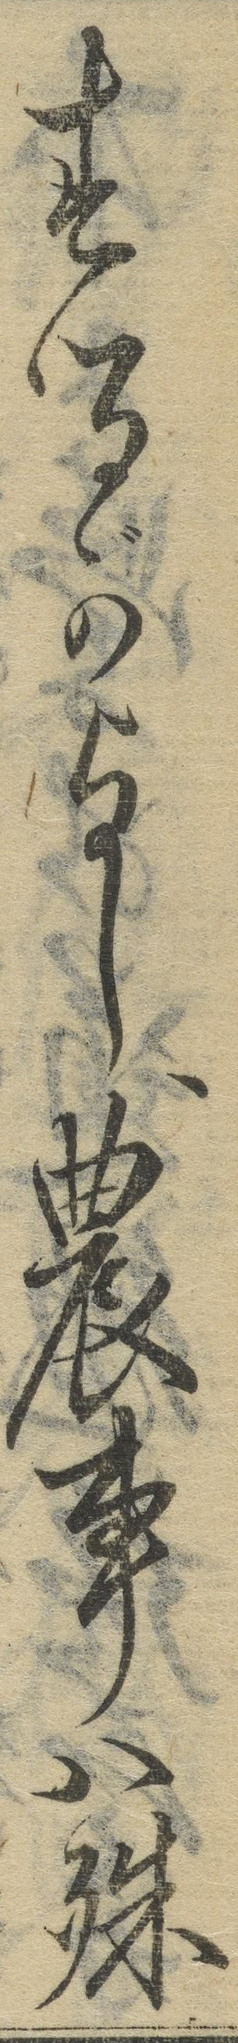するがよし、農事は殊
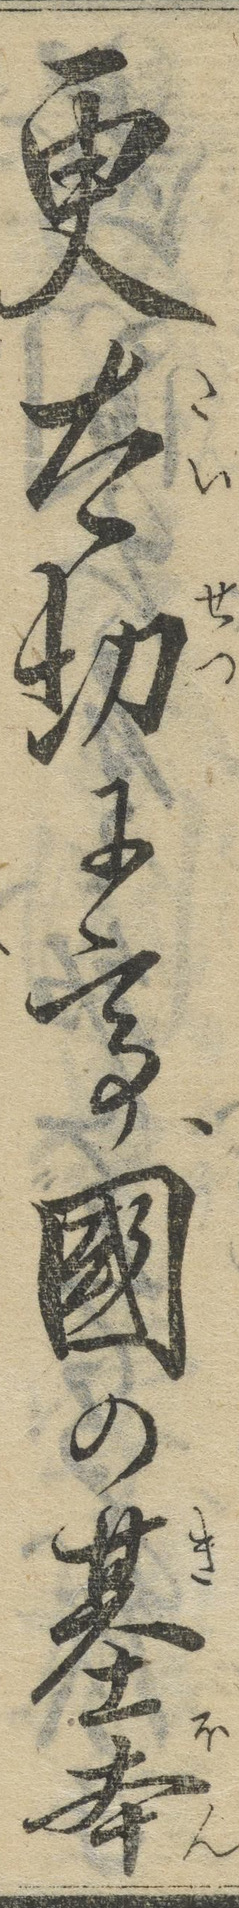更大切にて、国の基本
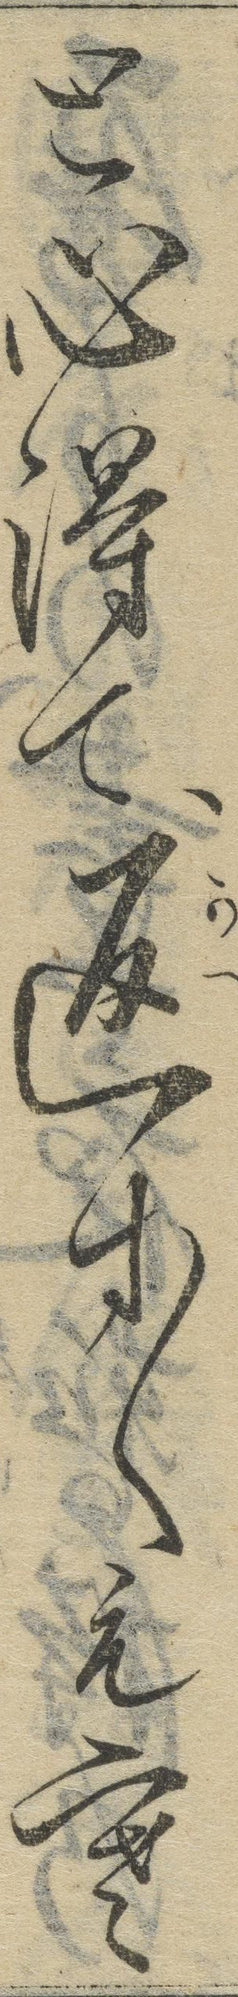と心得て、返す〳〵も寒
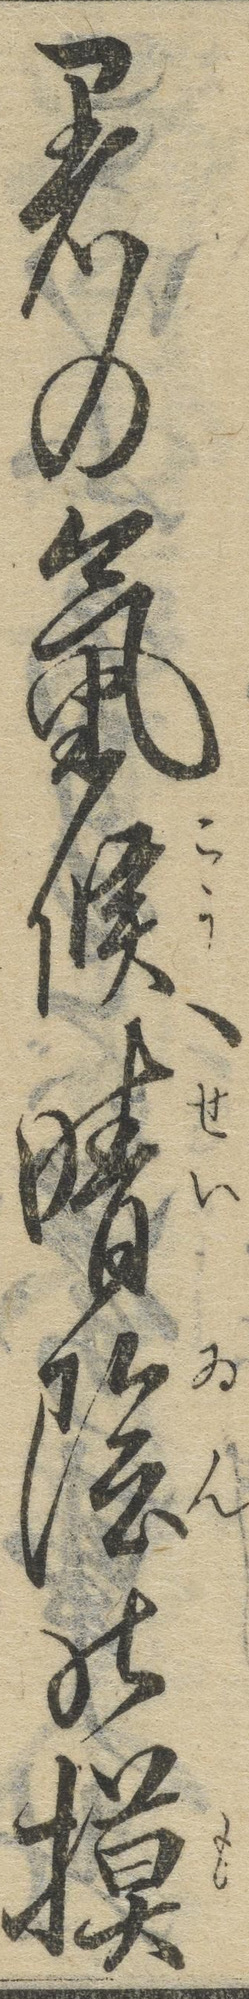暑の気候、晴陰の模
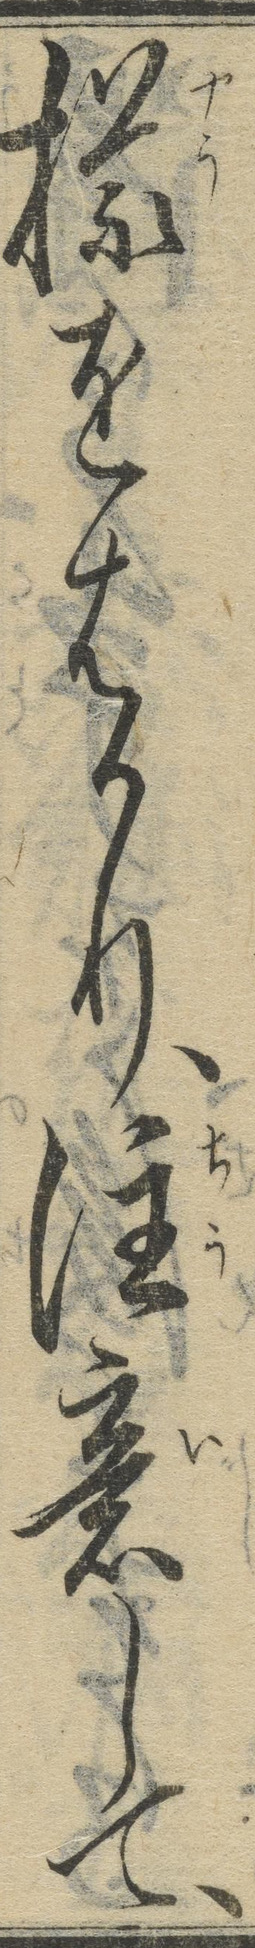様をはかり、注意して、
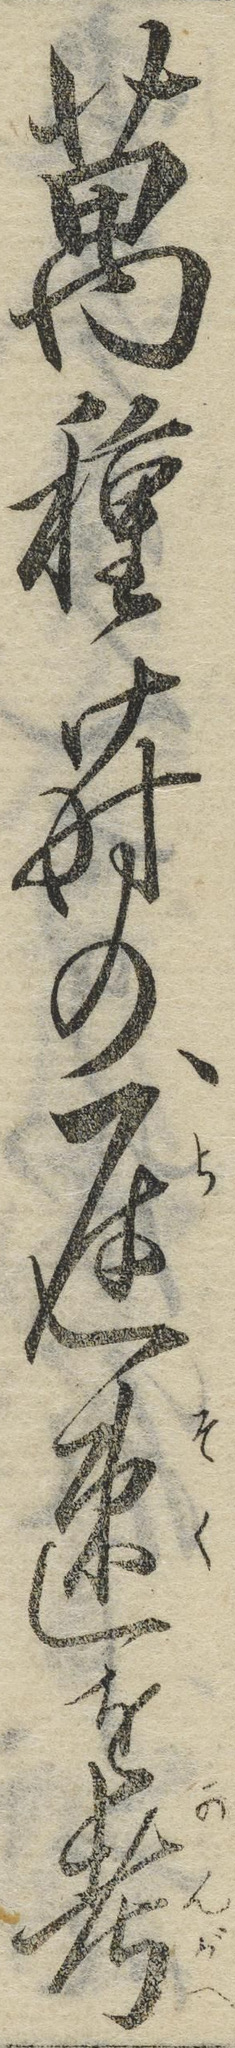萬種蒔の、遅速を考
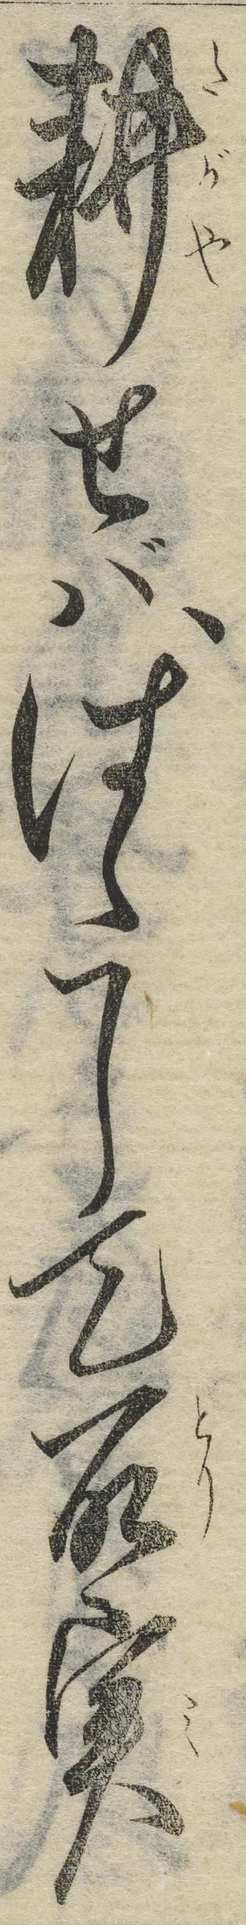耕せば、はたして取実
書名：暦日往来　單
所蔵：東京大学地震研究所図書室 Earthquake Research Institute Library, The University of Tokyo, JAPAN
